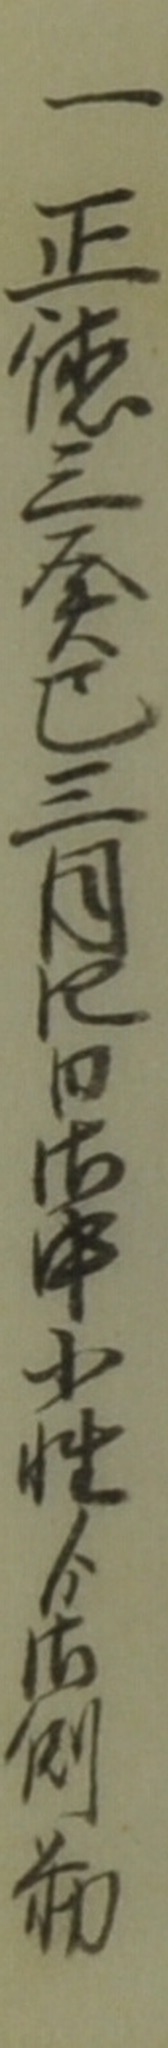一正徳三癸巳三月四日御中小性ゟ御側勤
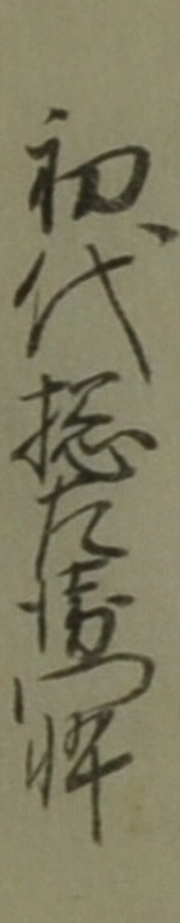初代総左衛門忰
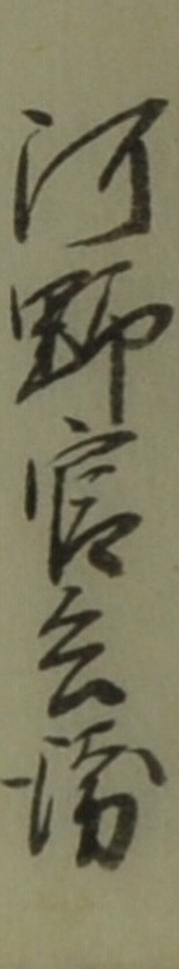河野官兵衛
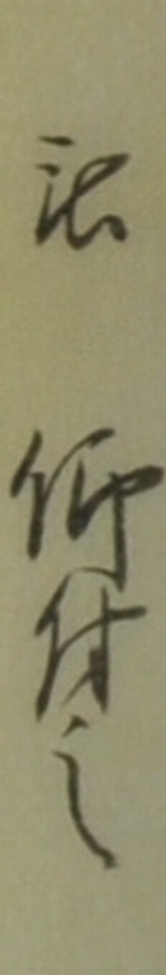被仰付之

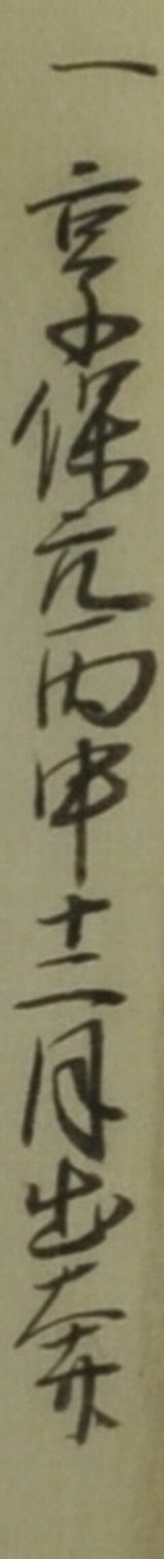一享保元丙申十二月出奔
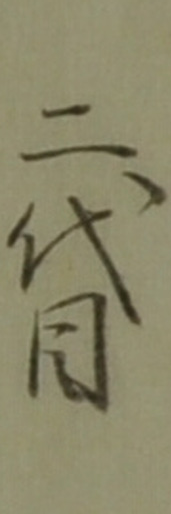二代目
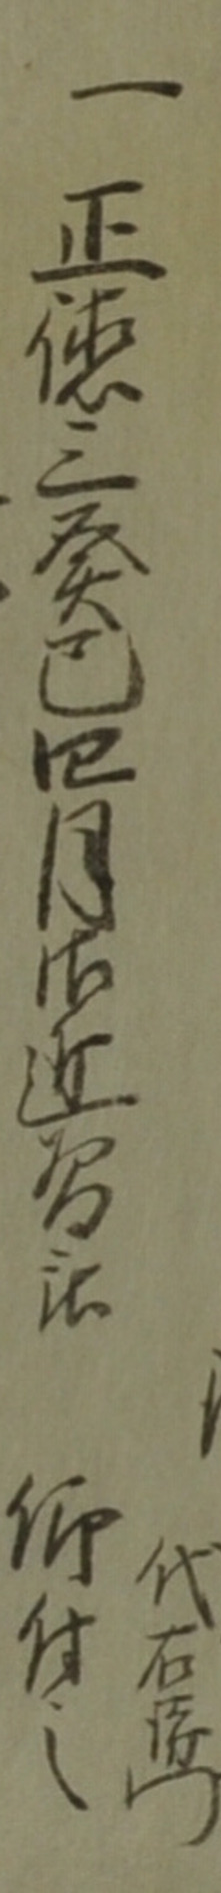一正徳三癸巳四月御近習被仰付之
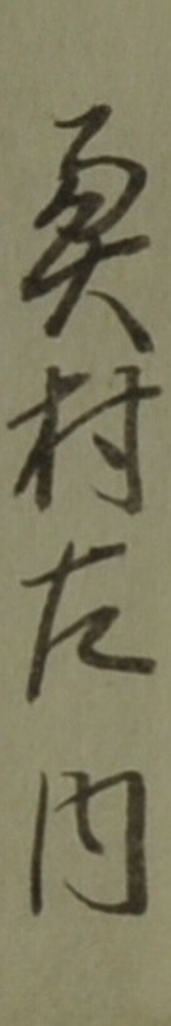奥村左内
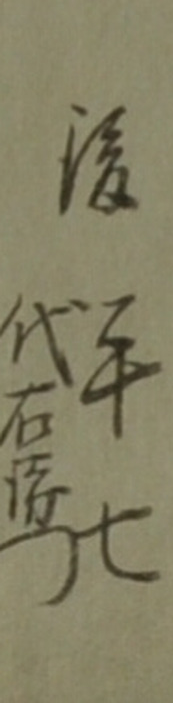後平七
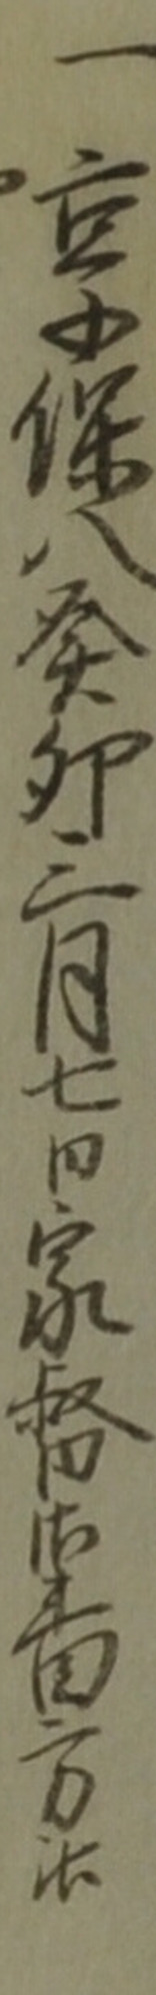一享保八癸卯三月七日家督御番方被
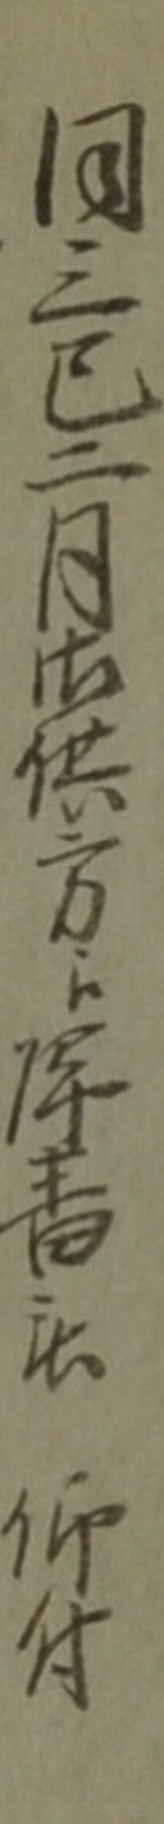同三巳二月御供方江帰番被仰付
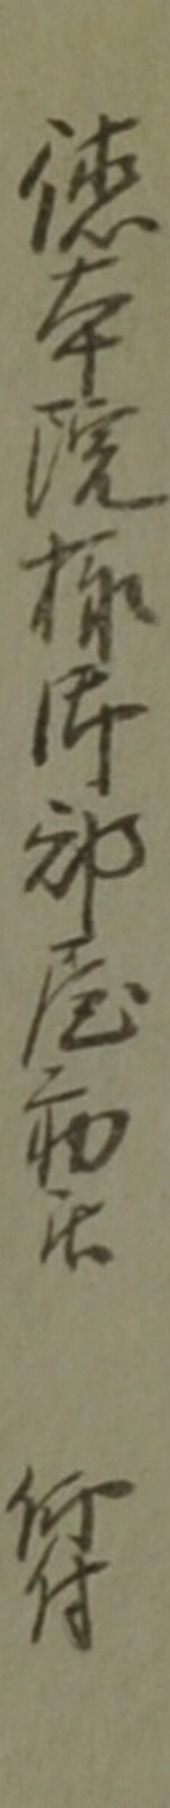徳本院様御部屋勤被仰付
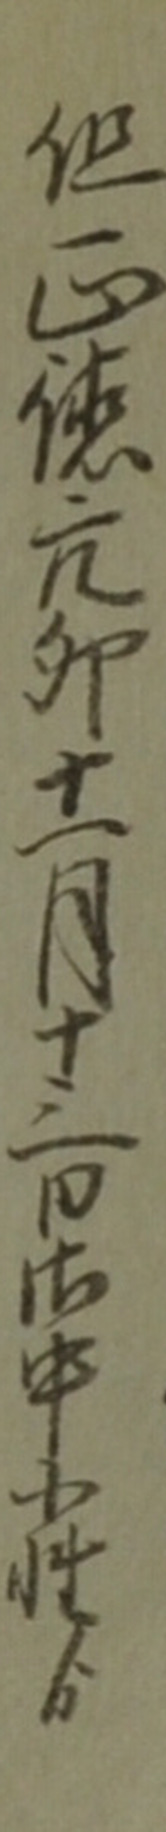但正徳元卯十一月十三日御中小性ゟ
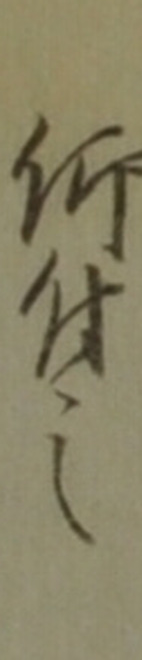仰付之
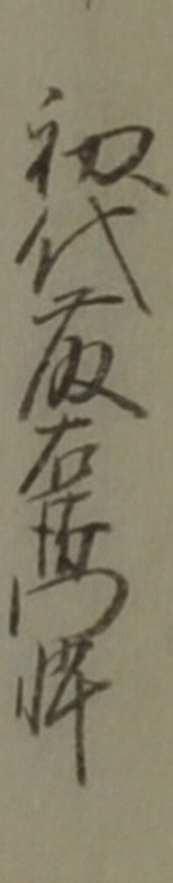初代藤右衛門忰
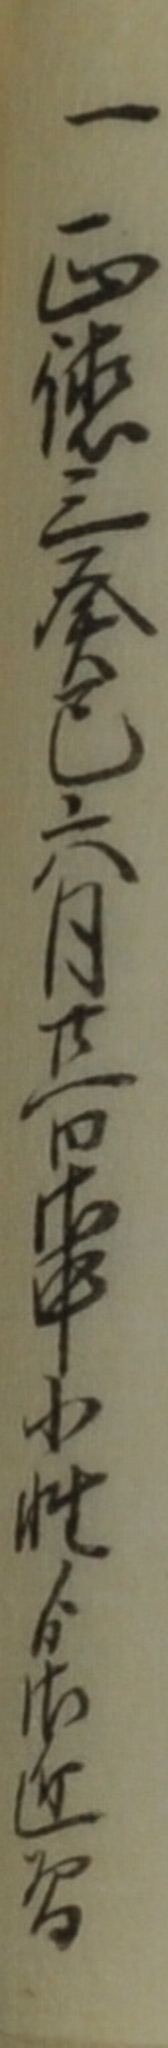一正徳三癸巳六月廿一日御中小性ゟ御近習
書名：諸御役代々録（五）
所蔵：伊那市立高遠町図書館・合同会社AMANE
